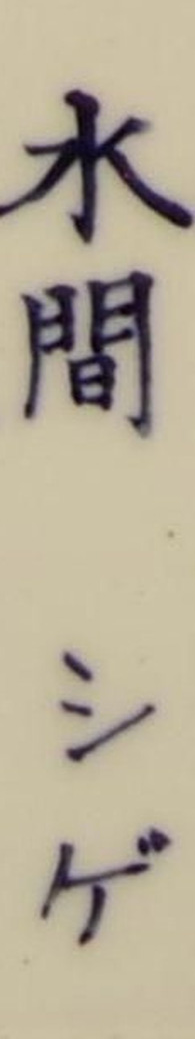水間シゲ
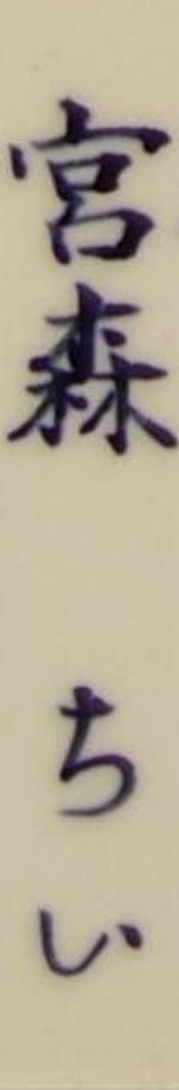宮森ちい
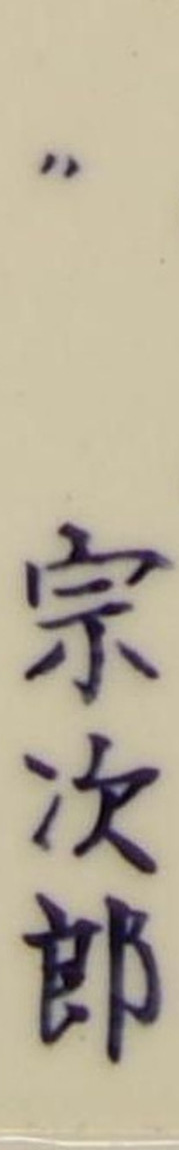宗次郎
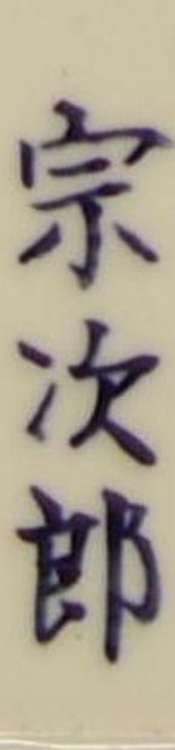宗次郎
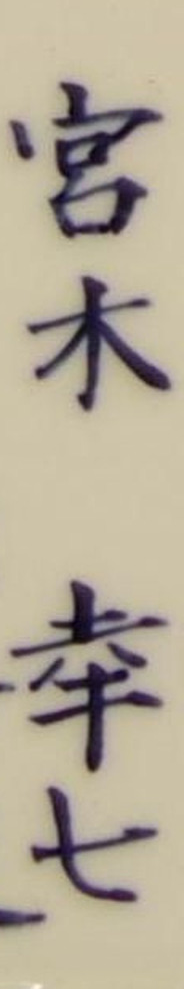宮木幸七
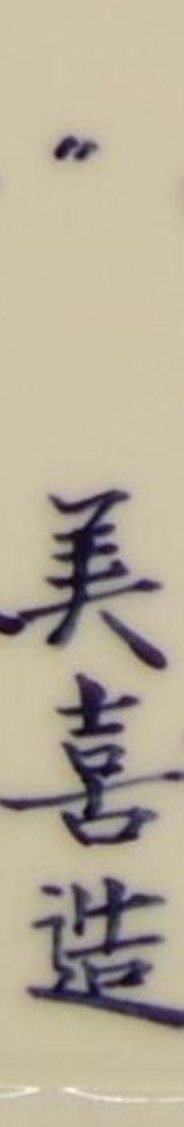美喜造
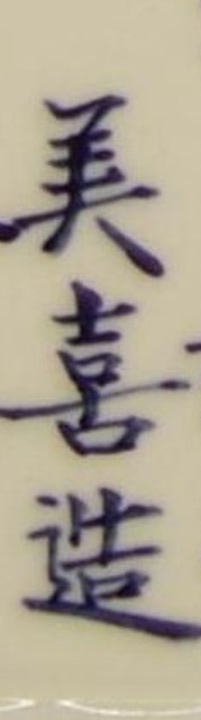美喜造
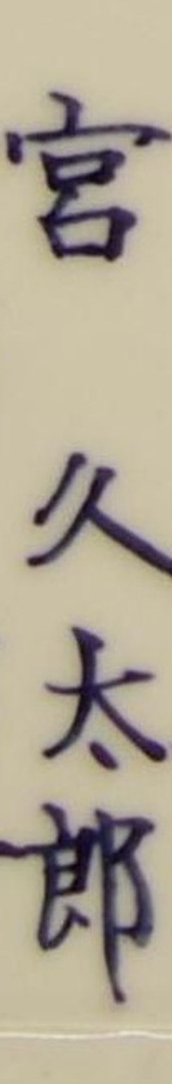宮久太郎
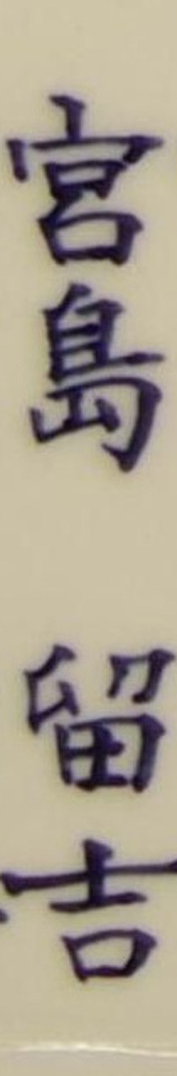宮島留吉
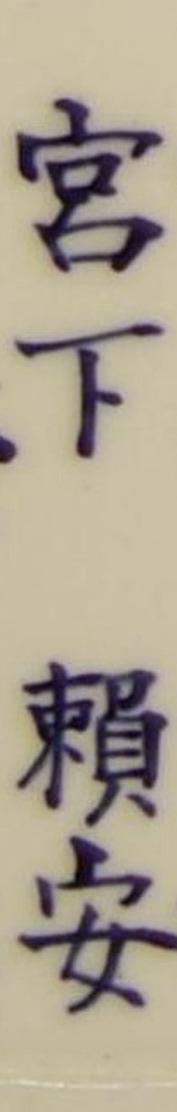宮下頼安
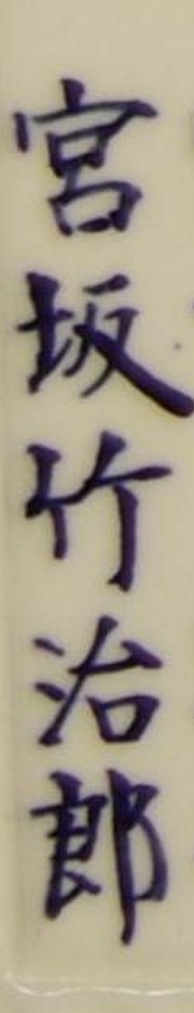宮坂竹治郎

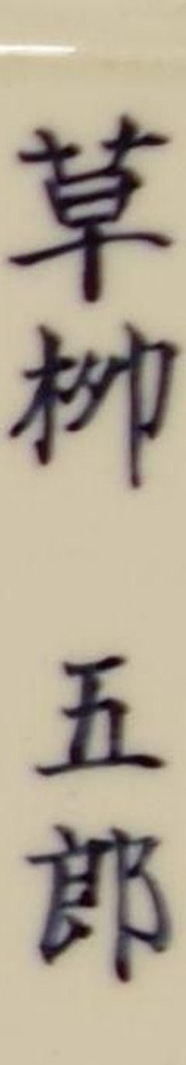草柳五郎
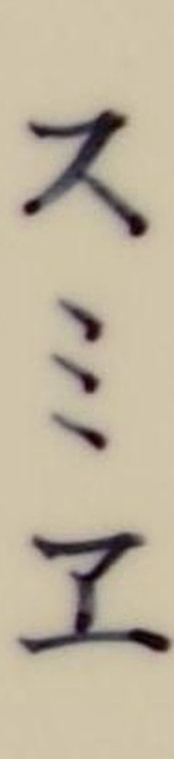スミエ
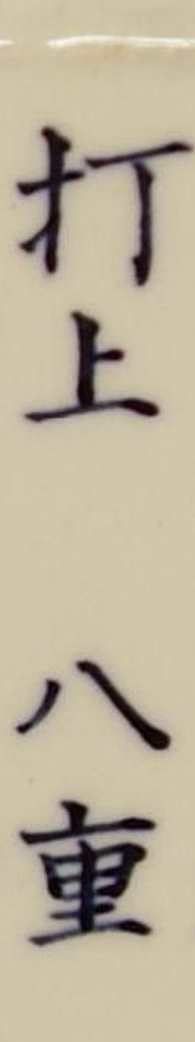打上八重
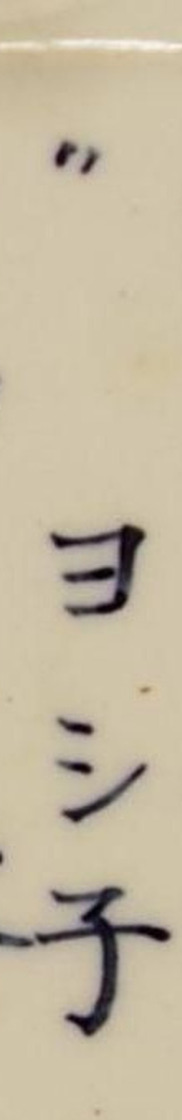ヨシ子
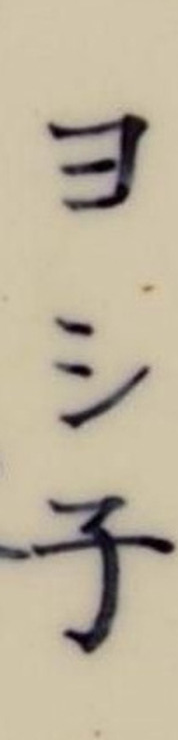ヨシ子
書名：E~L
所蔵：高野山金剛峯寺
